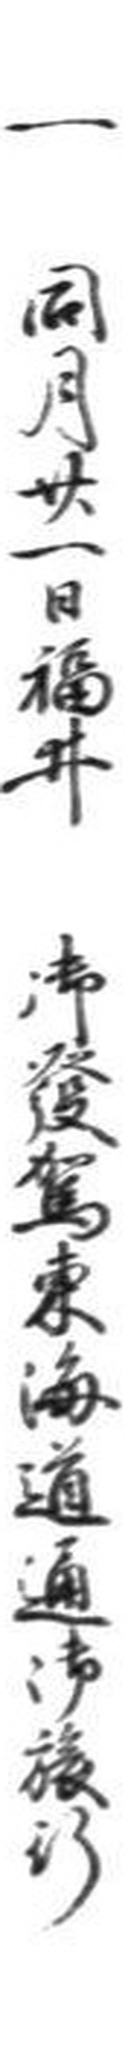一同月廿一日福井御発駕東海道通御旅行

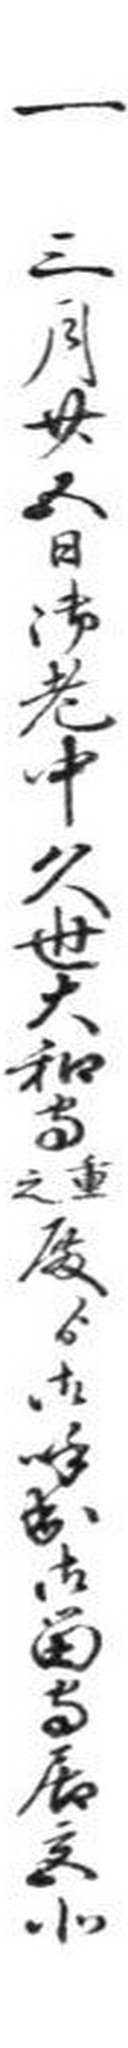一三月廿五日御老中久世大和守重之殿ゟ御呼出御留守居宮北
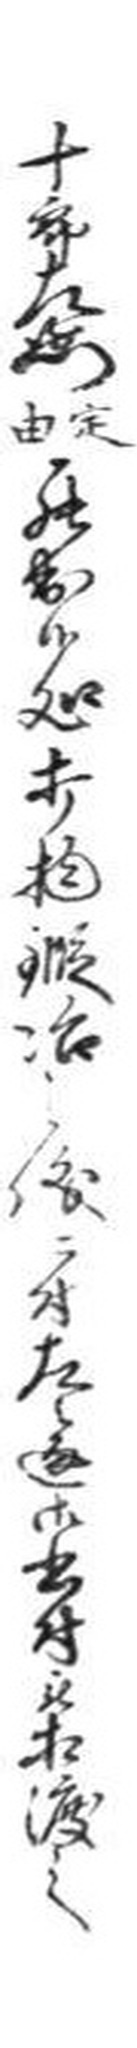十郎左衛門定由罷出候処打物鍛冶之儀ニ付左之通御書付相渡之
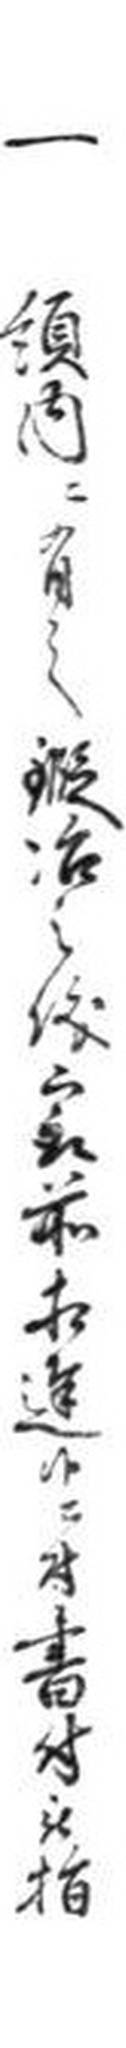一領内ニ有之鍛冶之儀最前相達候ニ付書付被指
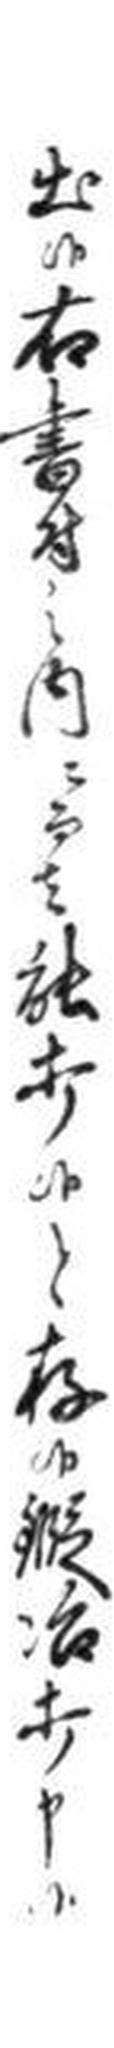出候右書付之内ニ而者能打候と存候鍛冶打申候
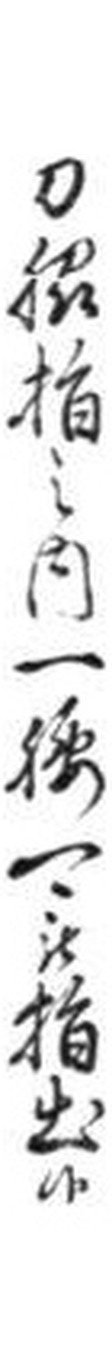刀脇指之内一腰可被指出候
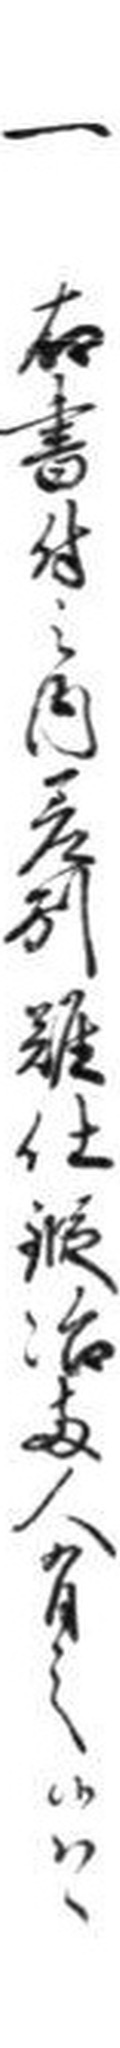一右書付之内差別難仕鍛冶両人有之候ハヽ
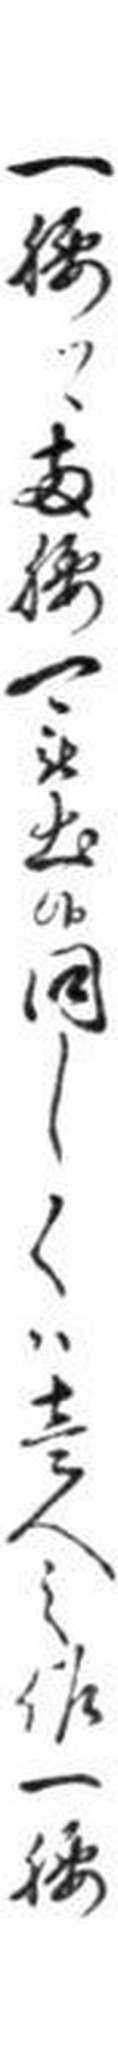一腰ツヽ両腰可被出候同しくハ壱人之作一腰
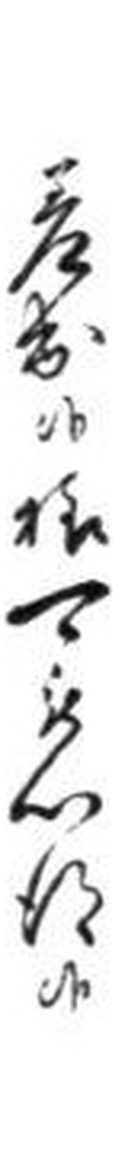差出候様可被心得候
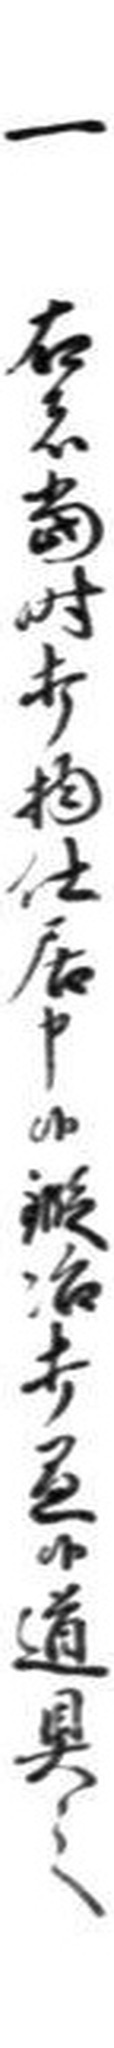一右者当時打物仕居申候鍛冶打置候道具之
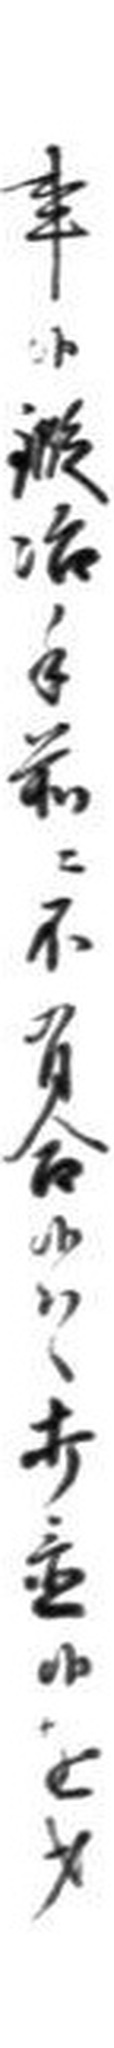事候鍛冶手前ニ不有合候ハヽ打置候を才
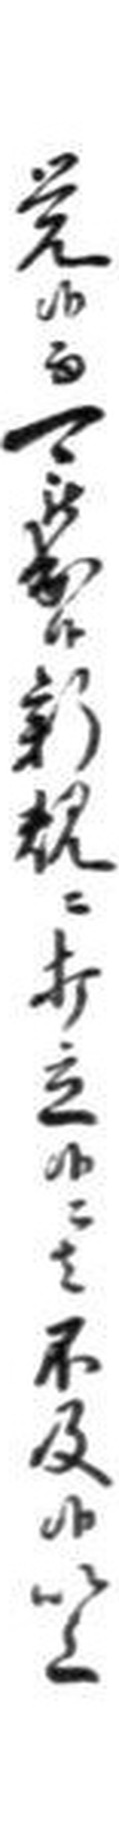覚候而可被出候新規ニ打立候ニ者不及候以上
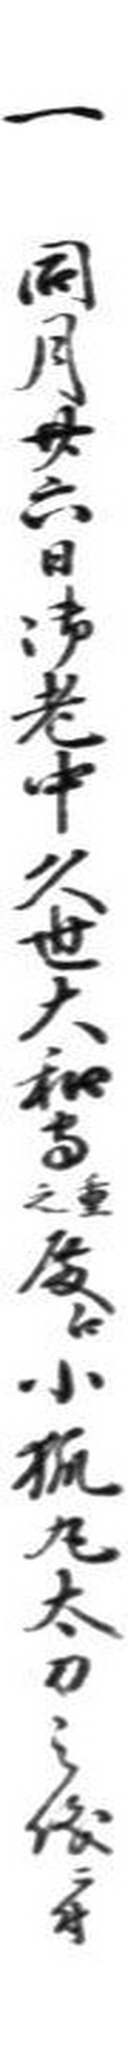一同月廿六日御老中久世大和守重之殿江小狐丸太刀之儀ニ付
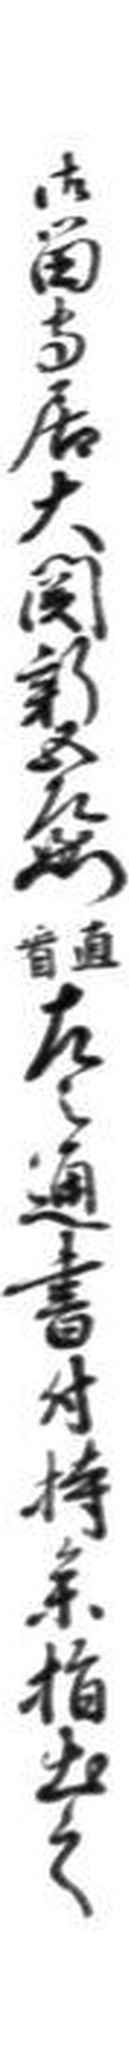御留守居大関新五左衛門直看左之通書付持参指出之
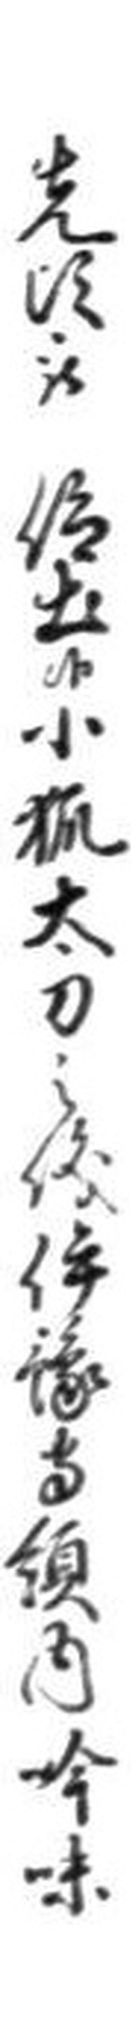先頃被仰出候小狐太刀之儀伊予守領内吟味
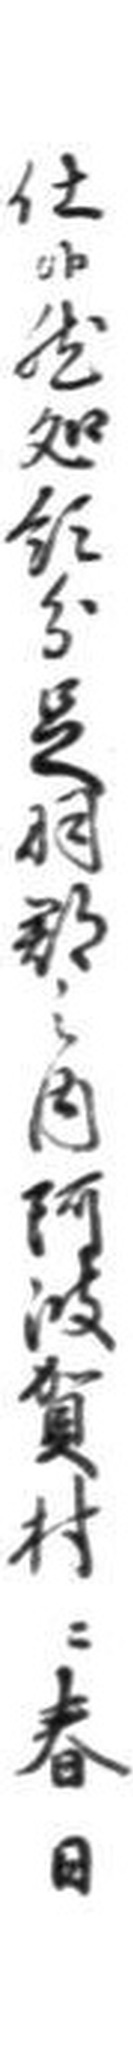仕候然処領分足羽郡之内阿波賀村ニ春日
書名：家譜 三十四 吉邦公 従享保五年到同六年
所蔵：福井県文書館 Fukui Prefectural Archives
